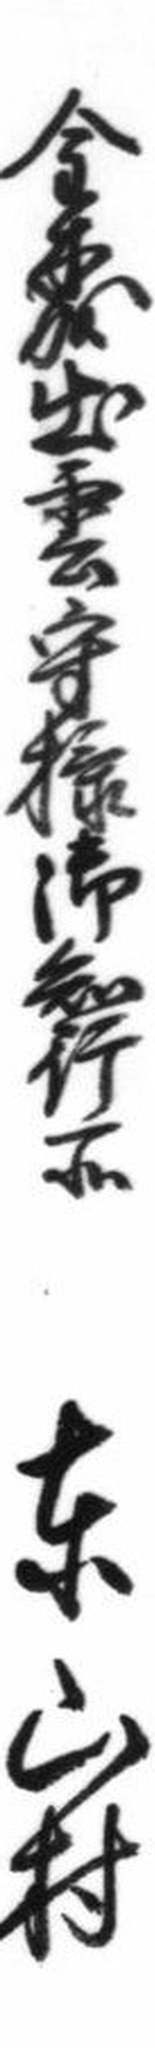金森出雲守様御知行所東山村
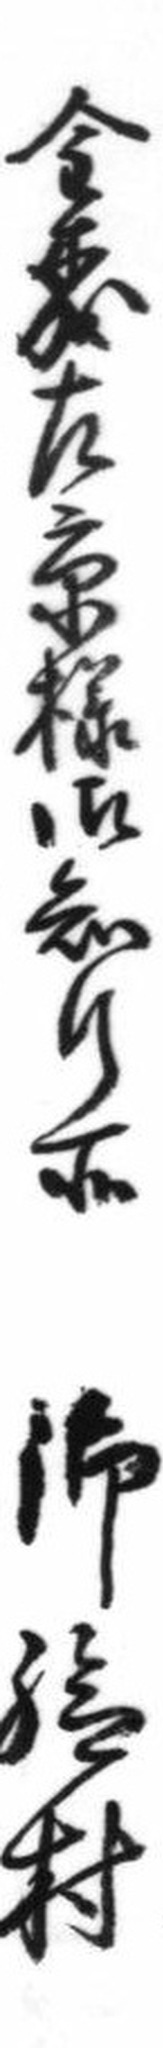金森左京様御知行所御給村
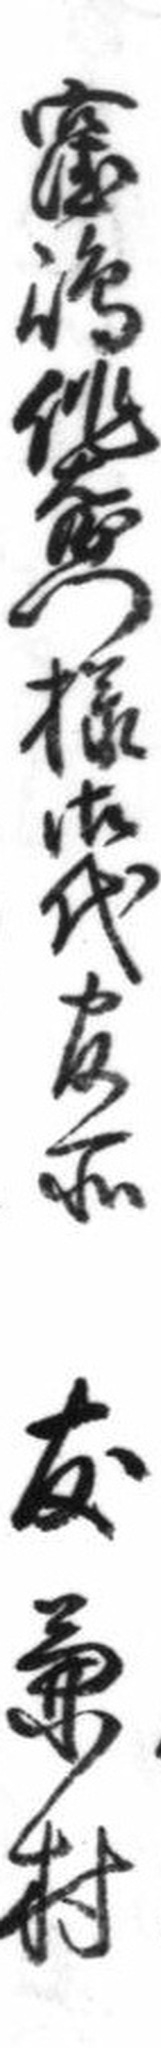窪嶋作左衛門様御代官所友兼村
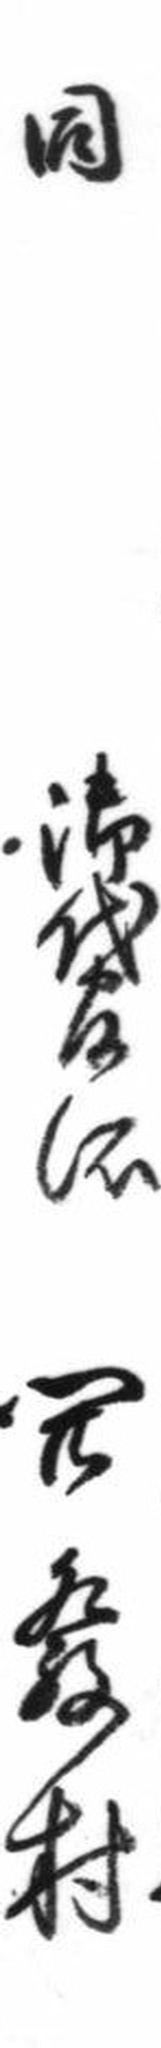同御代官所開發村
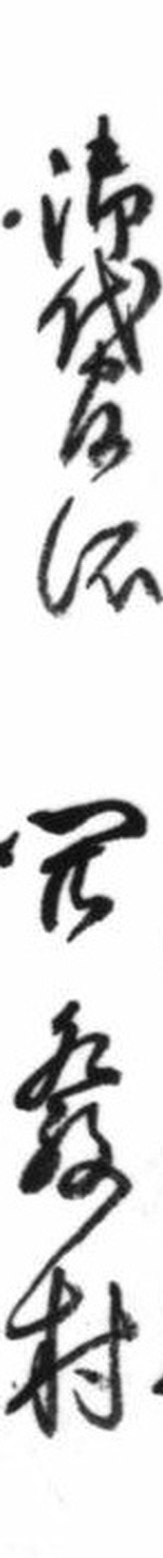同御代官所開發村
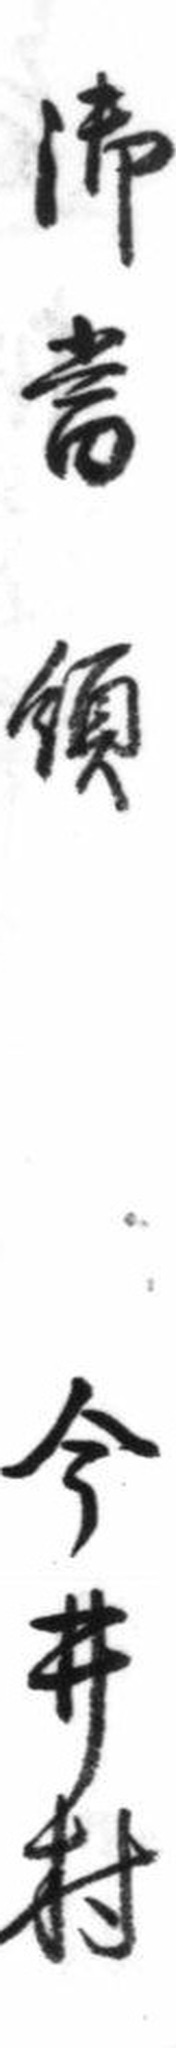御當領今井村
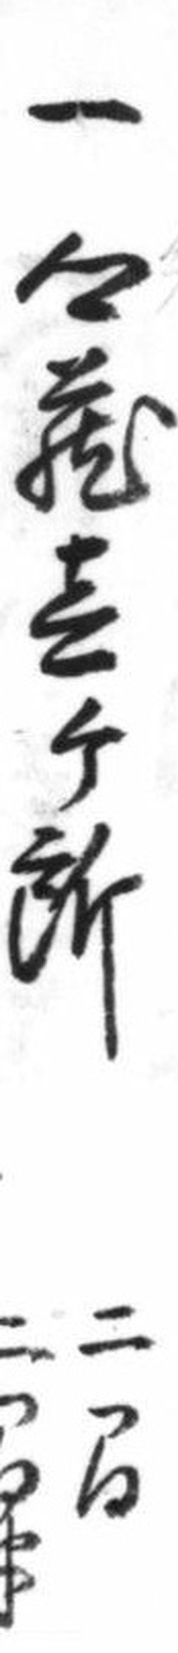一御蔵壱ケ所二間
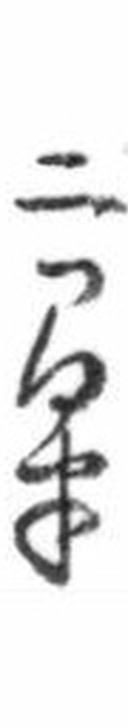二間半
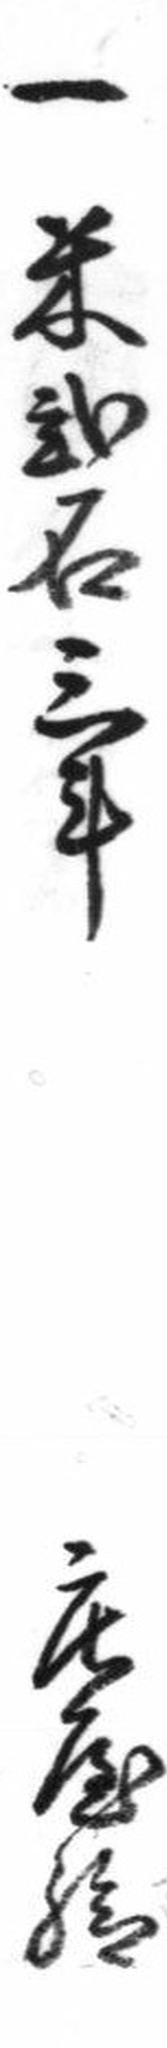一米弐石三斗庄屋給
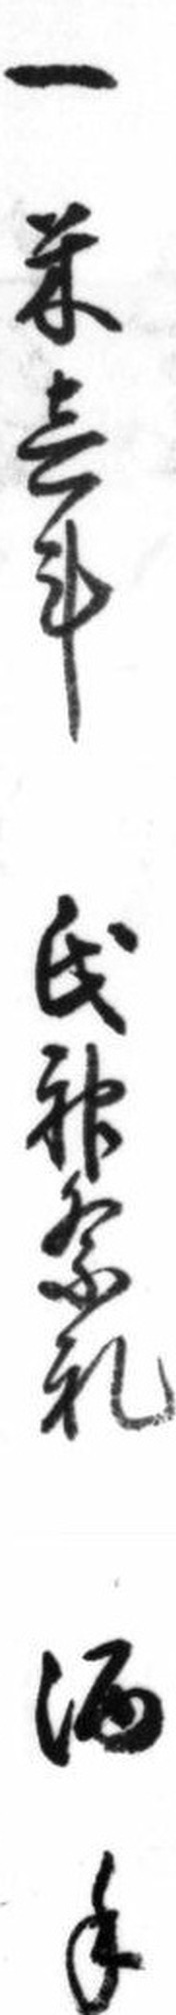一米壱斗氏神祭礼酒手
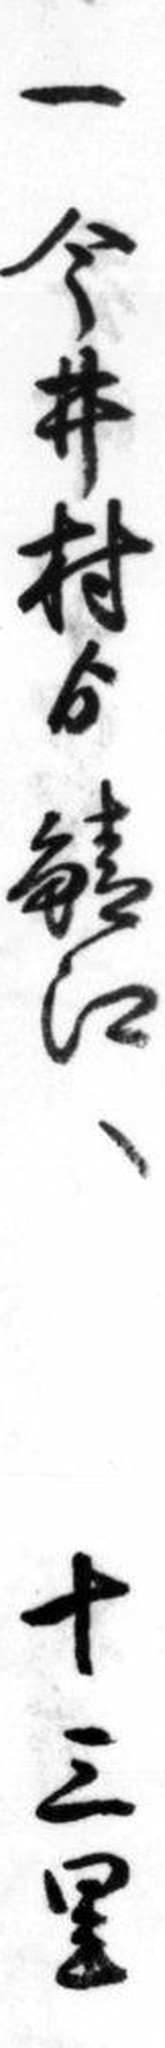一今井村ゟ鯖江ヘ十三里

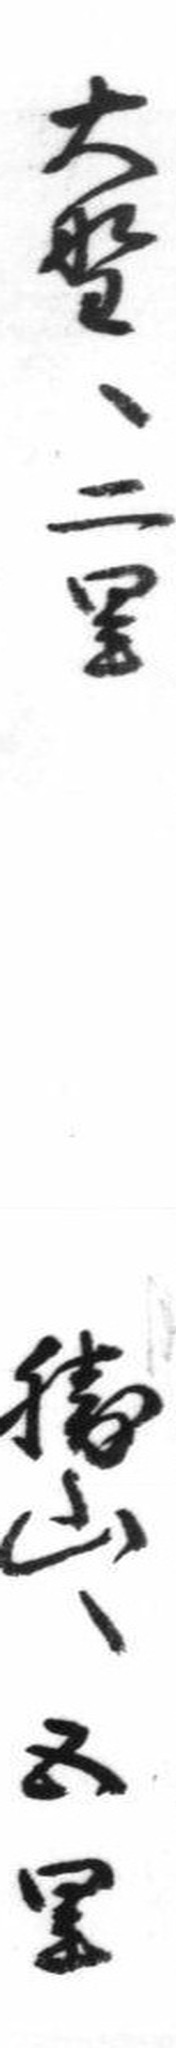大野ヘ二里勝山ヘ五里
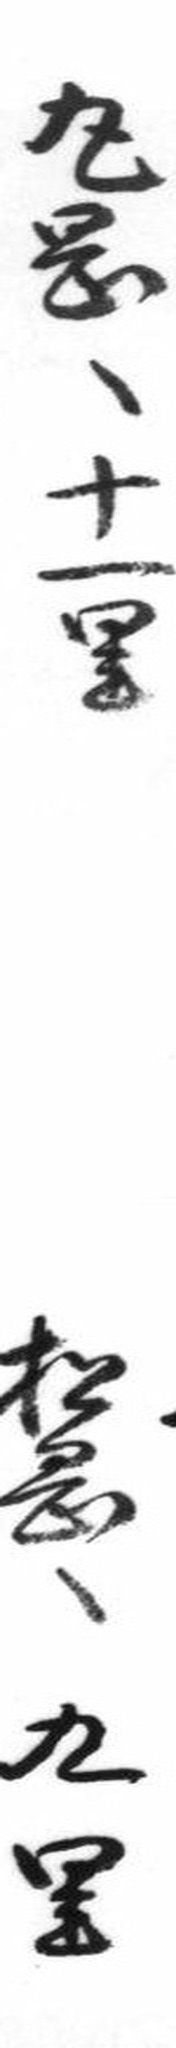丸岡へ十一里松岡へ九里
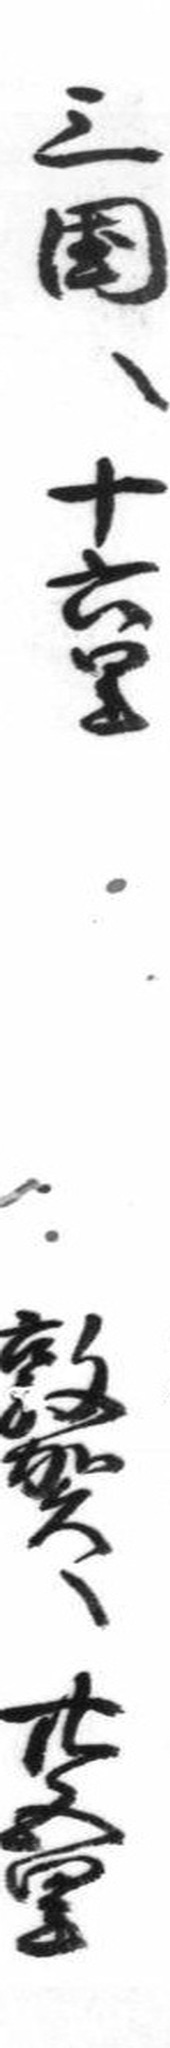三国ヘ十六里敦賀へ廿五里
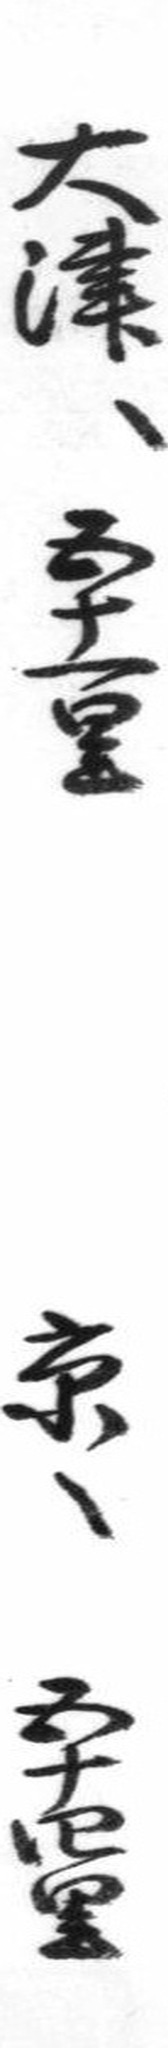大津へ五十一里京へ五十四里
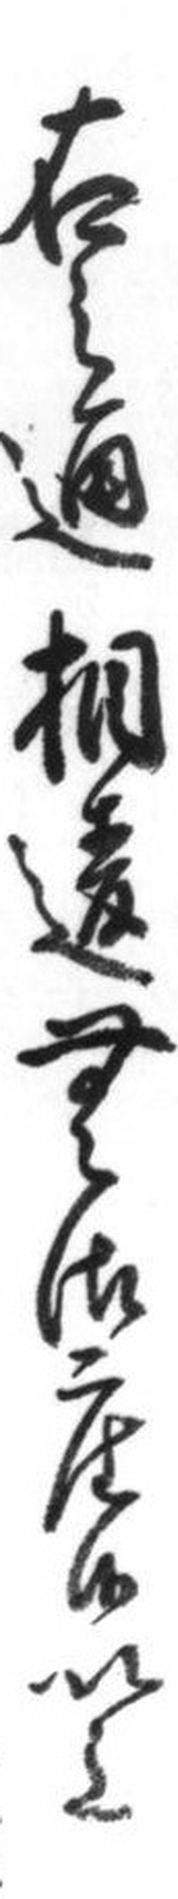右之通相違無御座候以上
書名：越前国大野郡今井村明細帳
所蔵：福井県文書館 Fukui Prefectural Archives
